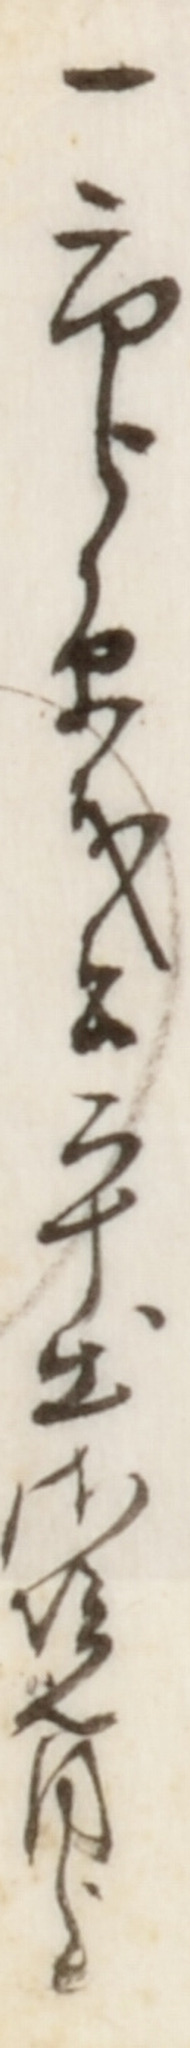一市郎兵衛義者平出御境目迄
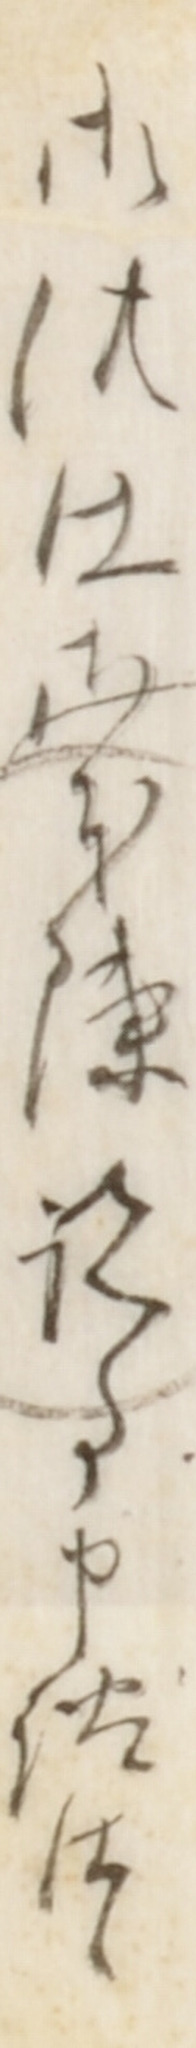御供仕御本陣諸事申談仕候
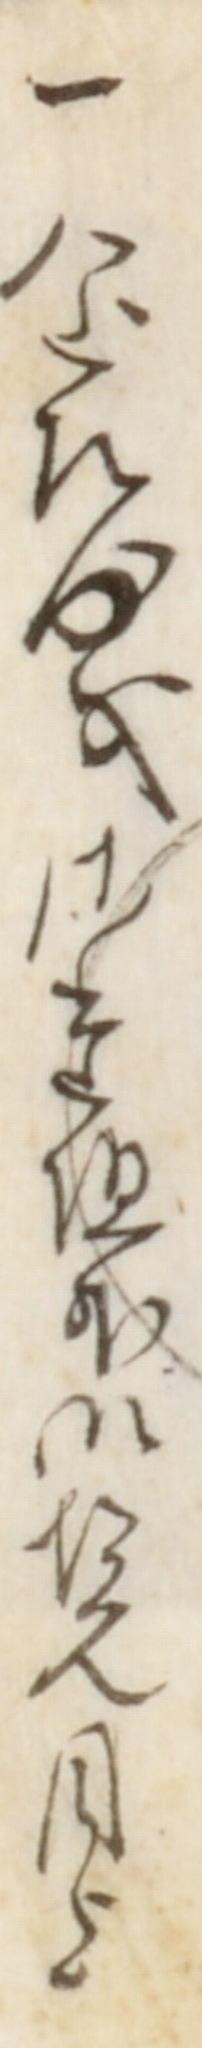一金左衛門義御堂垣外御境目迄
